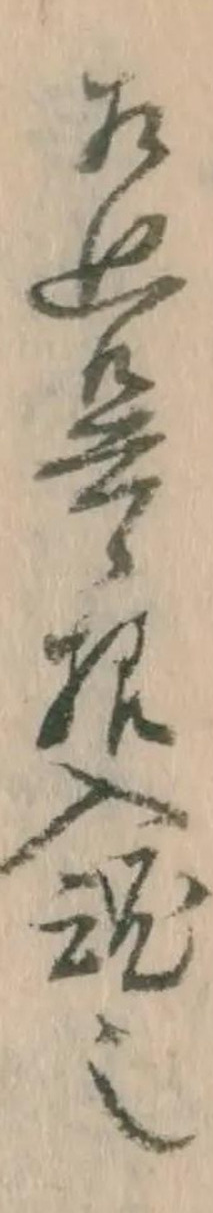相廻呉候様入魂也
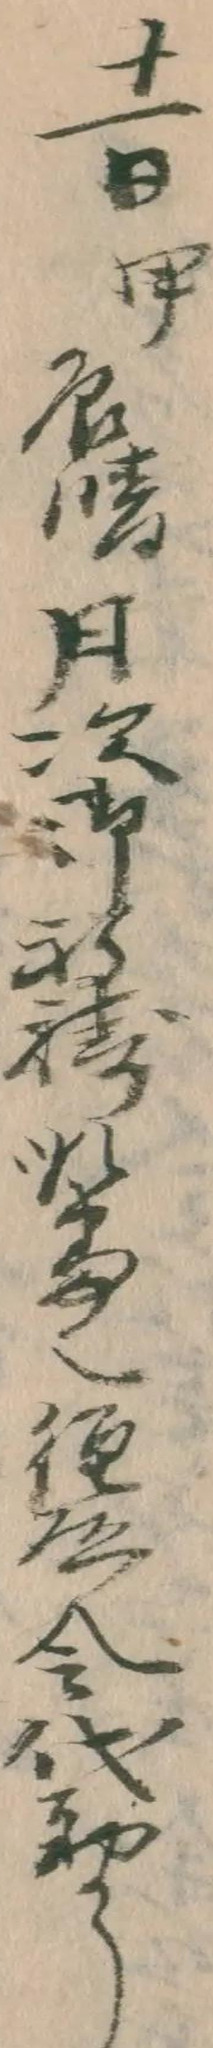十一日甲辰晴月次御祈祷順番也経啓令代勤了
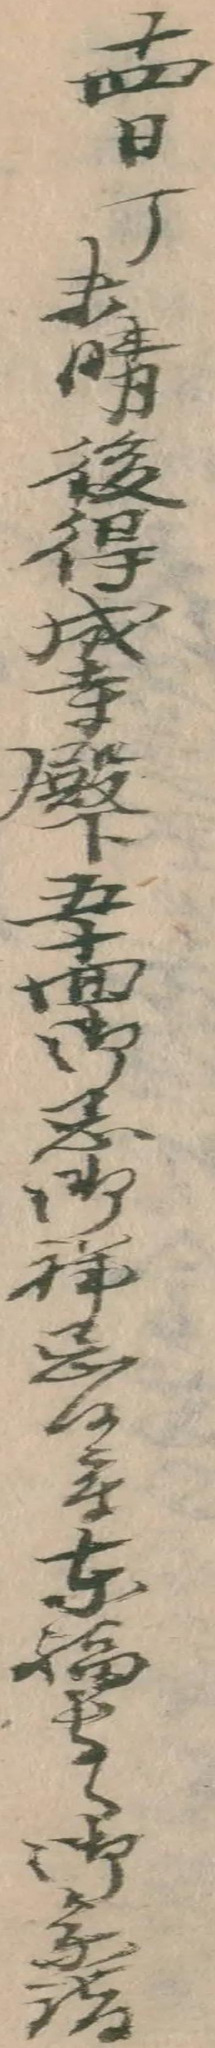十四日丁未晴後得成寺殿下五十回御忌御祥忌日ニ付東福寺へ御参詣
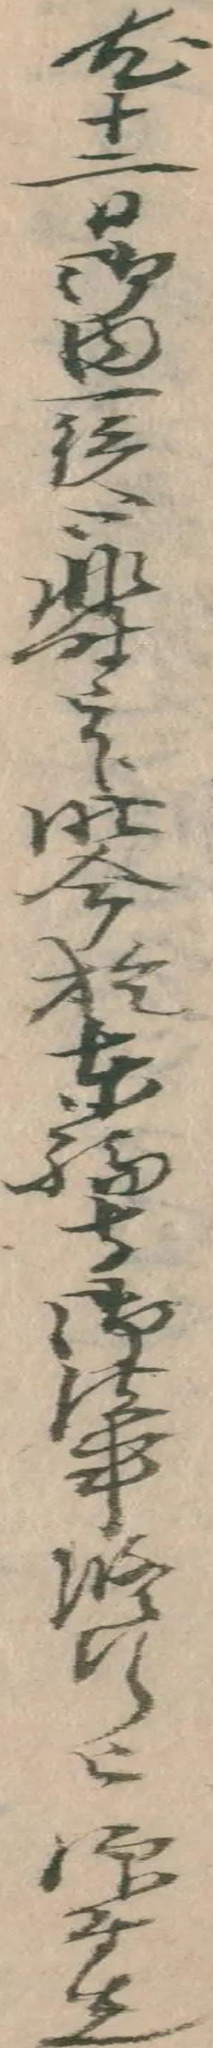尤十二日御内一統ヘ御臨時被下昨今於東福寺御法事修行被仰付先
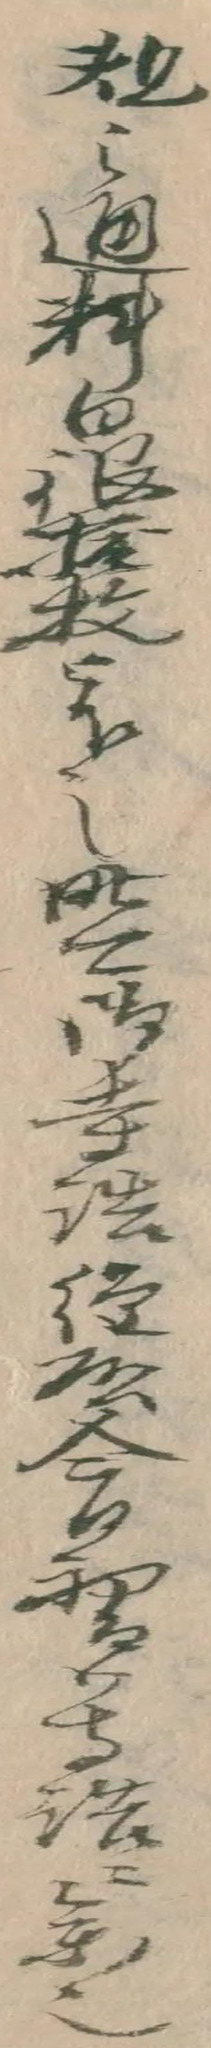規之通料白銀拾枚被下也昨今御寺法経啓今日初而御寺詰ニ参也
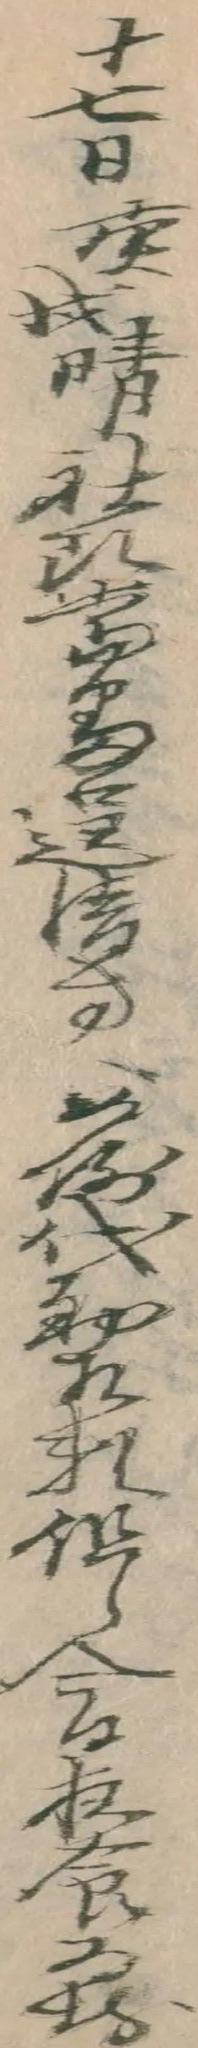十七日庚戌此晴社頭當番逞清方へ如例代勤相頼但し今日夜食為持
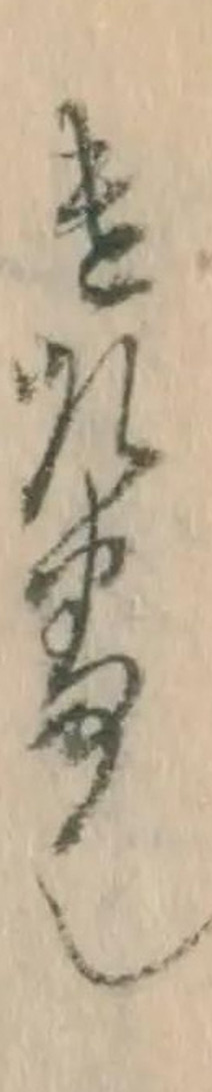遣順番也
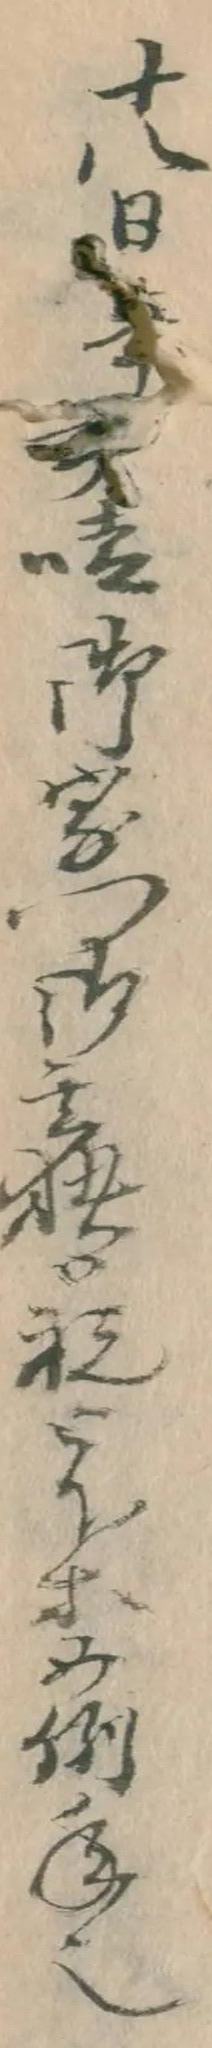十八日辛亥晴御家門御玄猪御祝被下等如例年也

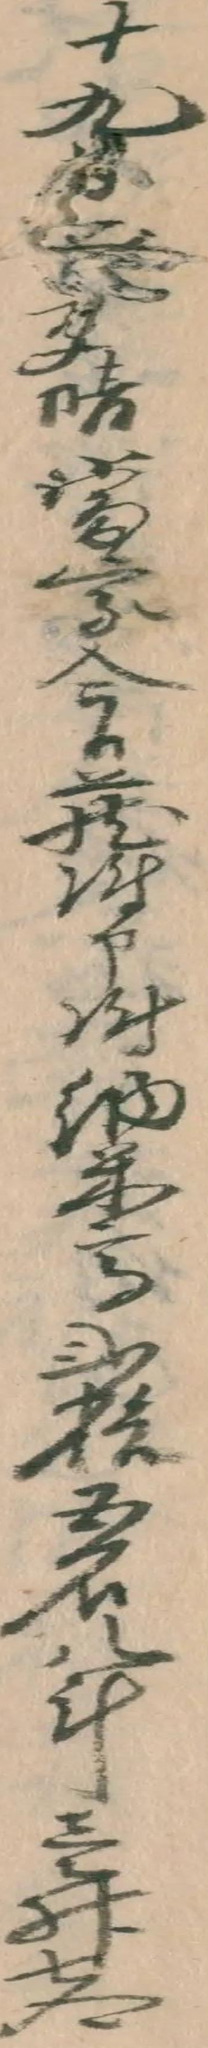十九日壬子晴當家今日蔵附申附納米高弐拾五石八斗壱升七合
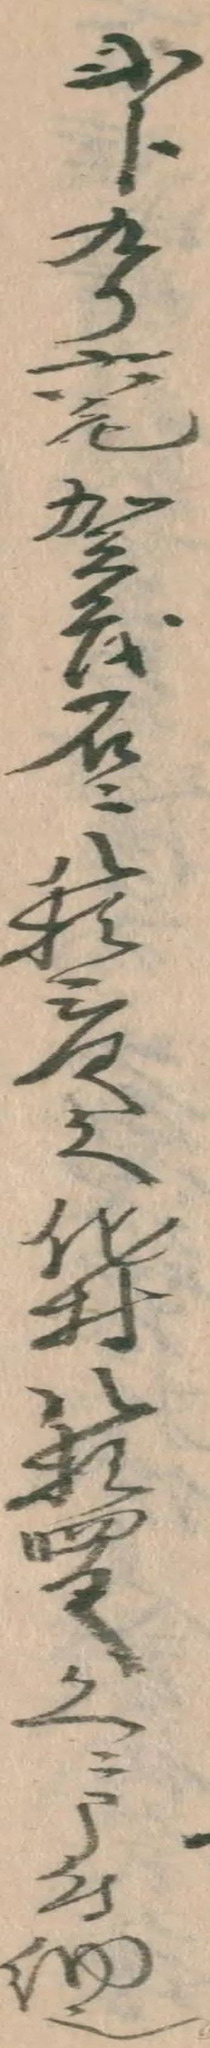弐分九り六毛賀茂石ニ八拾三匁代村八拾四匁かへに申付納也
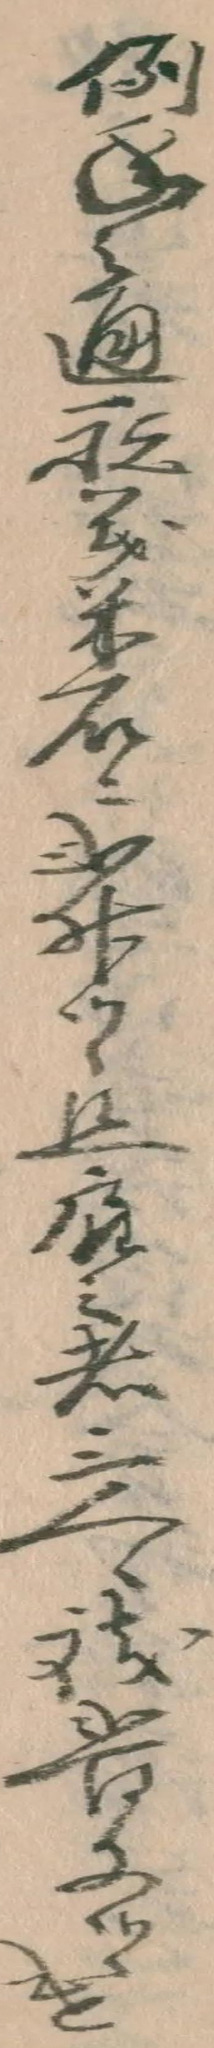例年之通祝義米石二弐升ツヽ且雇之者三人へ残弐百文ツヽ遣
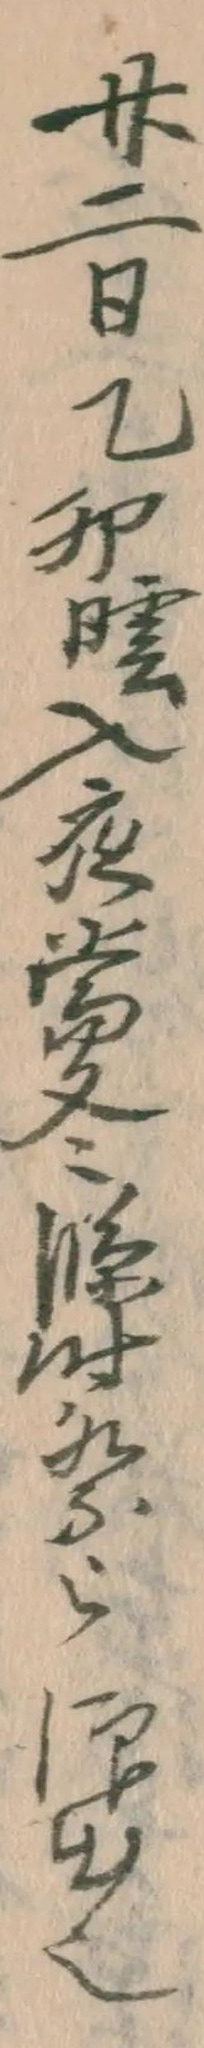廿二日乙卯曇入夜當冬臨時祭被仰出也
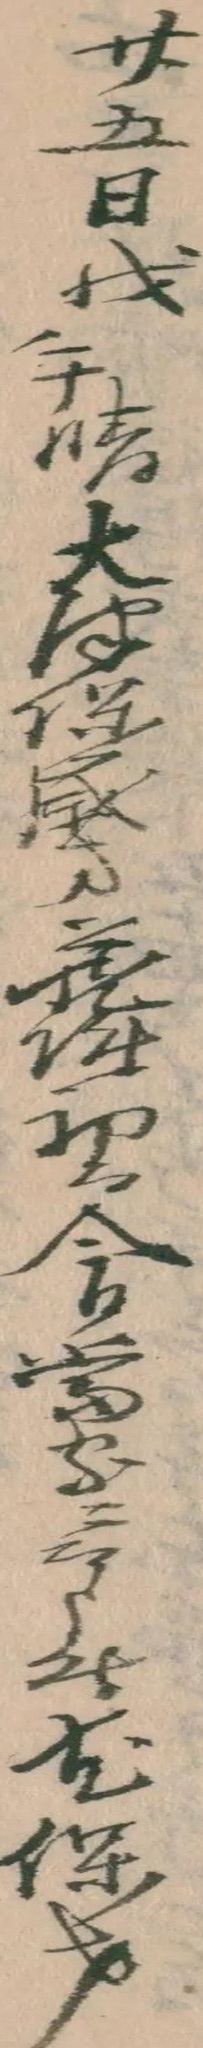廿五日戊午晴大津保歳方蔵附初而今日當家ニ而申付尤保才
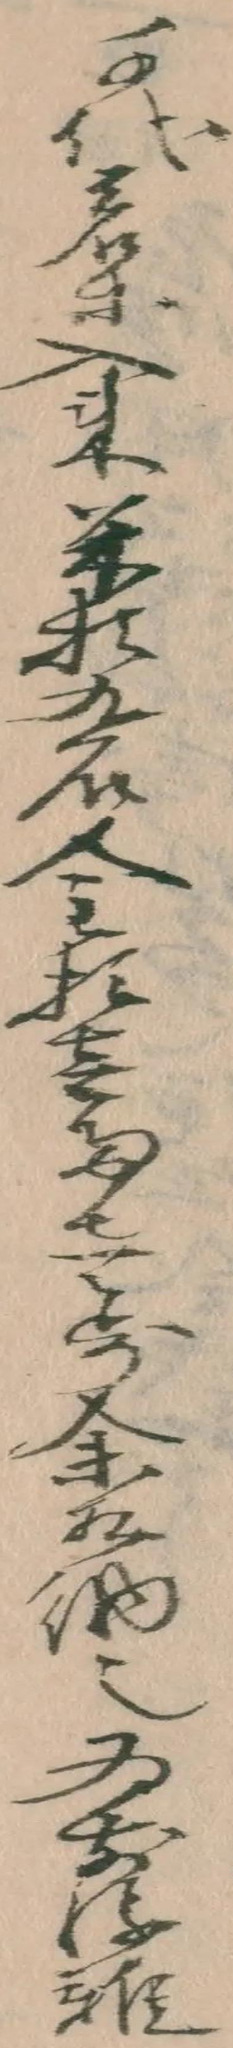千代若等入来米拾九石金拾壱両七歩余相納也為前後雑
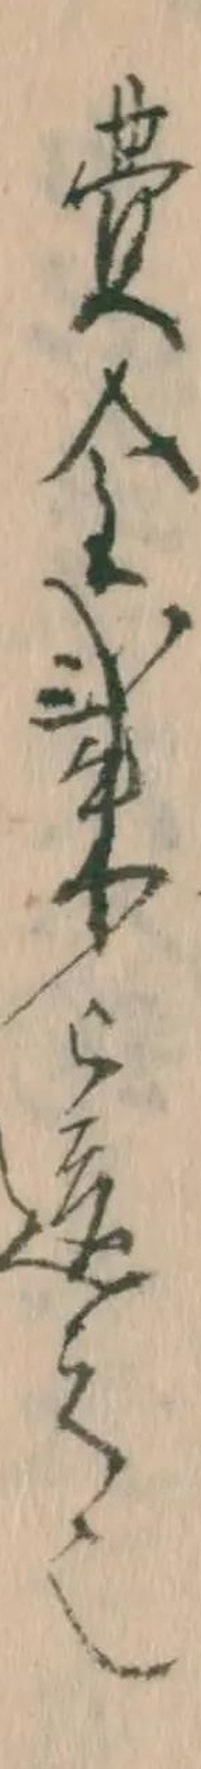費金弐朱被送之也
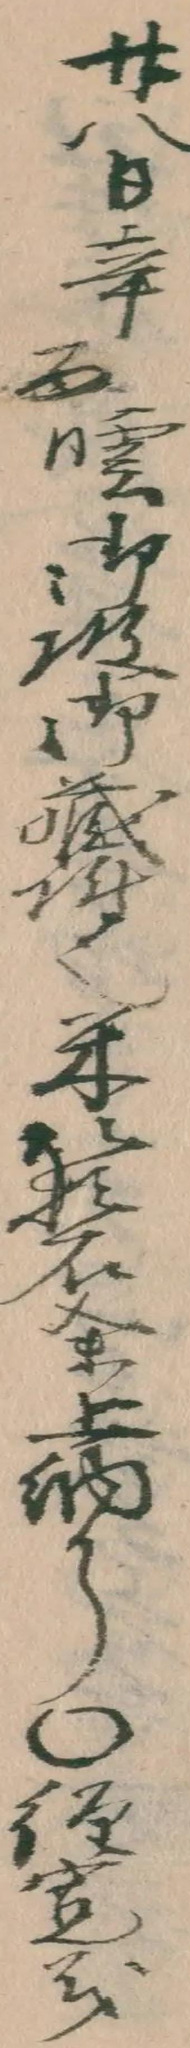廿八日辛酉曇御殿御蔵附也米八拾石余上納了〇経寛義
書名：賀茂社記録. 第69冊
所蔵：国立国会図書館 National Diet Library, JAPAN
